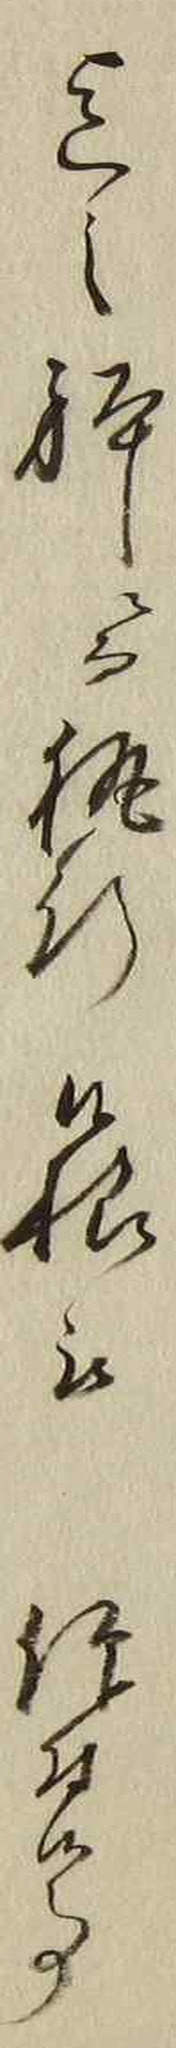迄之躰ニ而執行候様被仰付候事
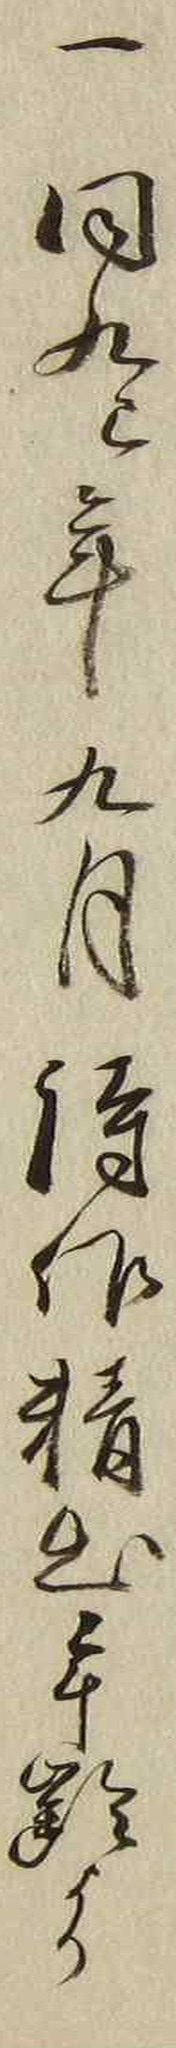一同九巳年九月詩作精出年齢より
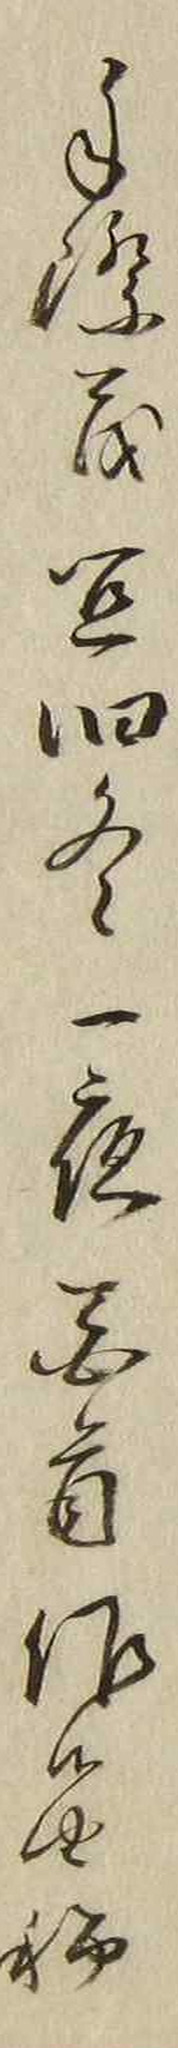手際茂宜旧冬一夜百首作候由稀
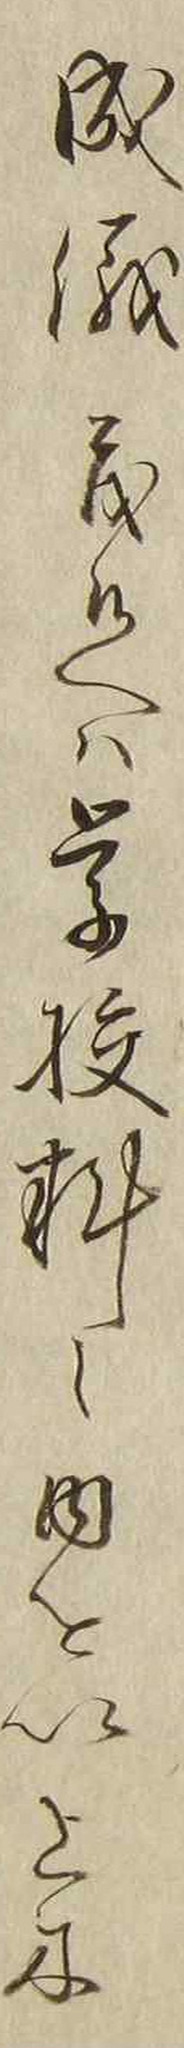成儀茂候へハ学校料之内を以上木

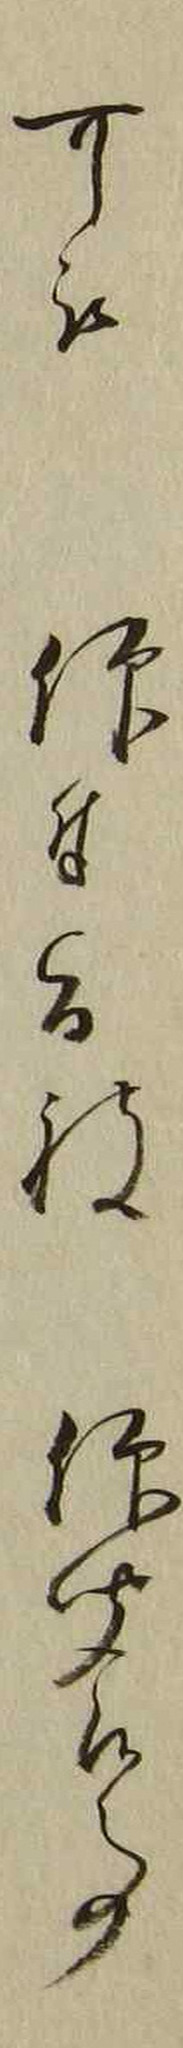可被仰付旨被仰聞候事
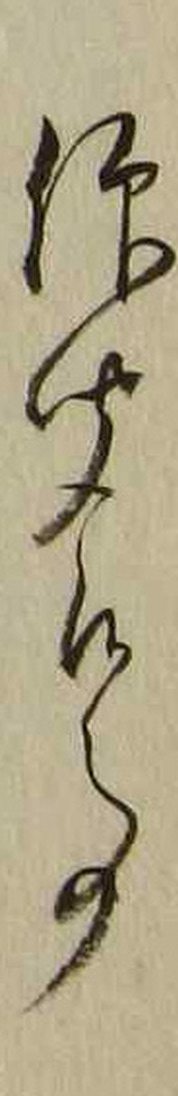仰聞候事
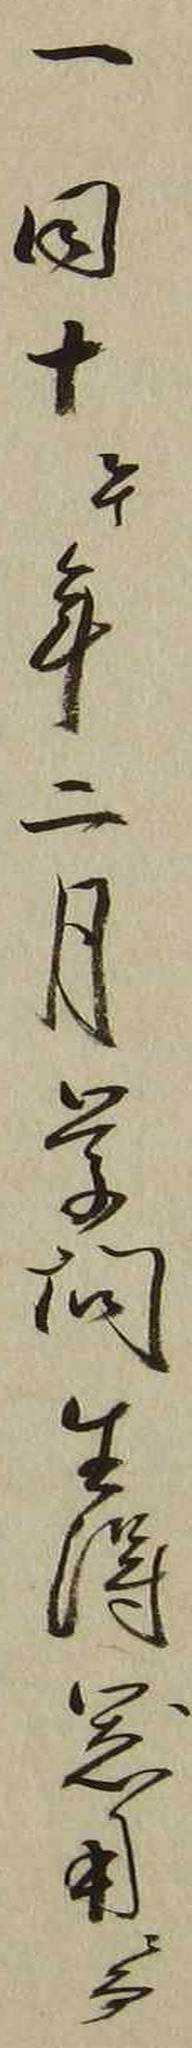一同十午年二月学問生得器用ニ而
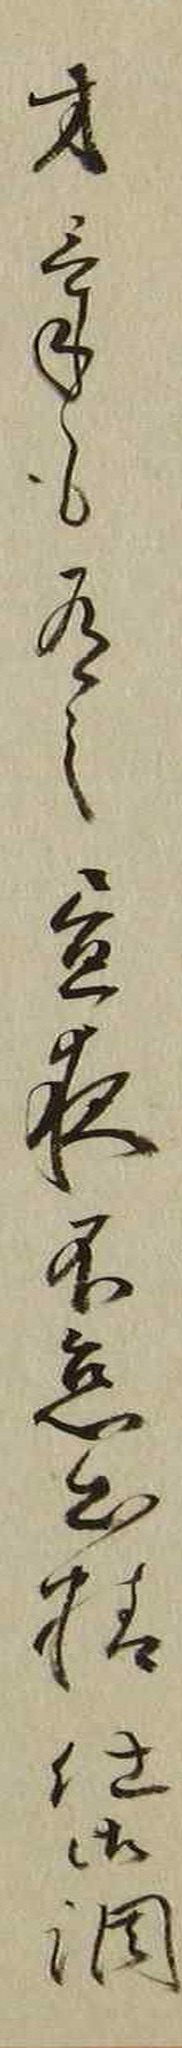才気も有之昼夜不怠出生仕御調
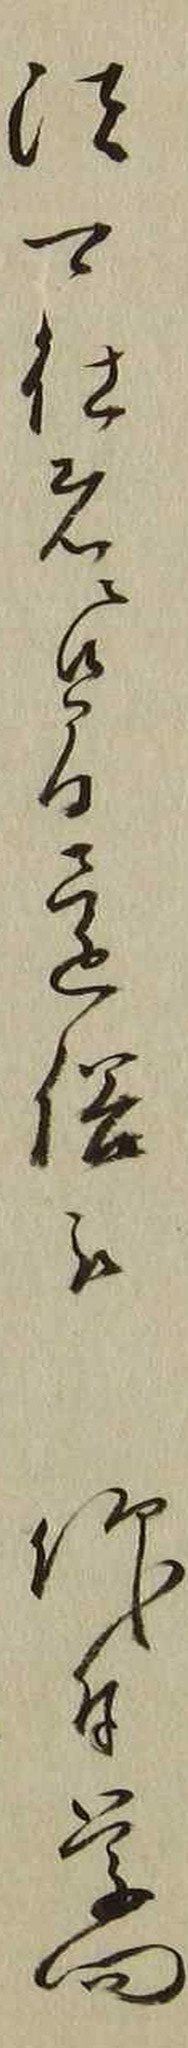法可仕者ニ候間遠俗被仰付学問
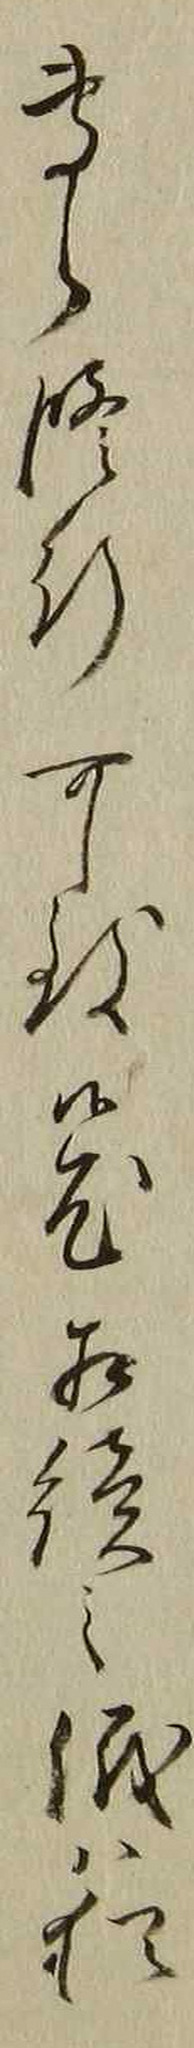専ら修行可致候尤相続之儀ハ猶
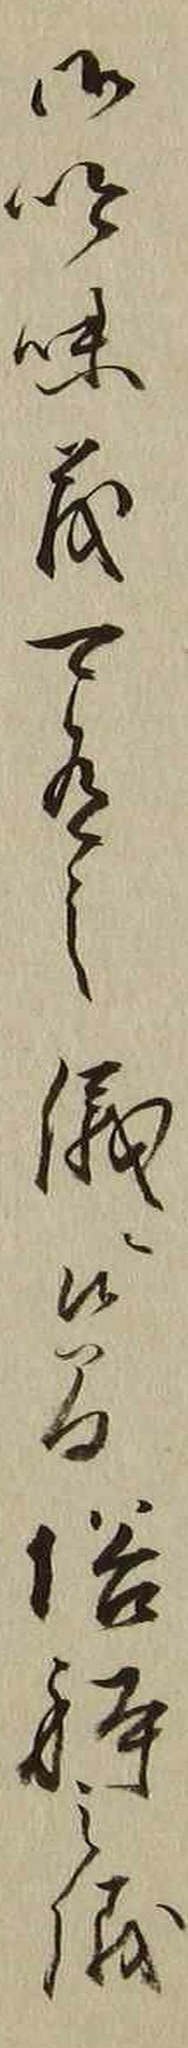御吟味茂可有之儀ニ候間俗躰之儀
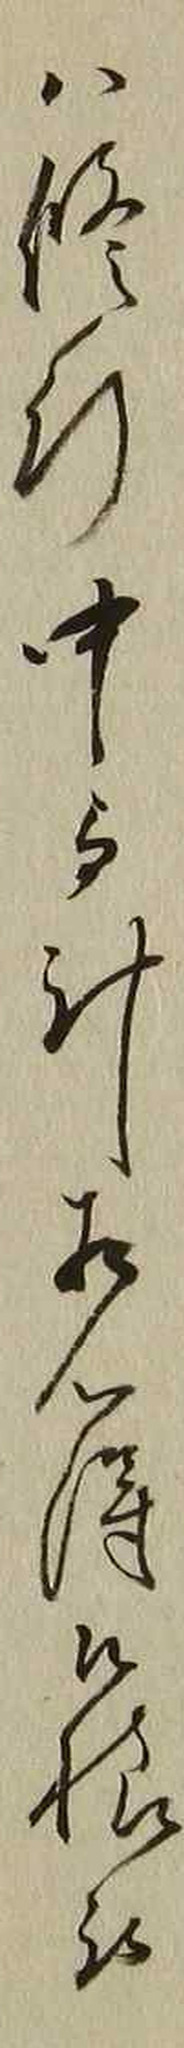ハ修行中ニ而計相心得候様被
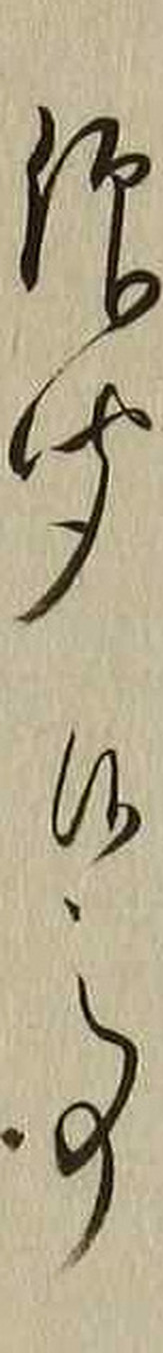仰聞候事
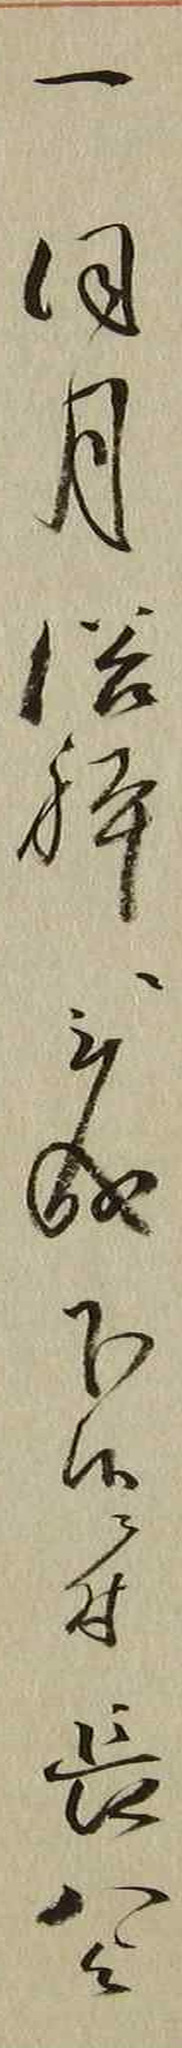一同月俗躰ヘ被成下候ニ付長八与
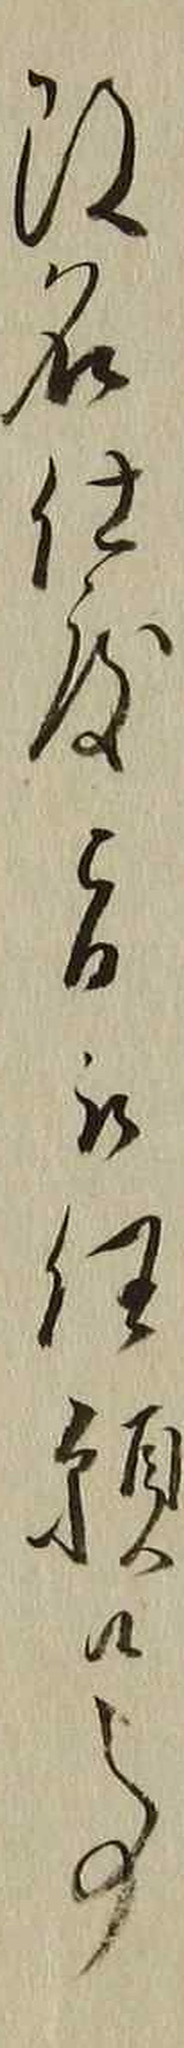改名仕度旨被任願候事
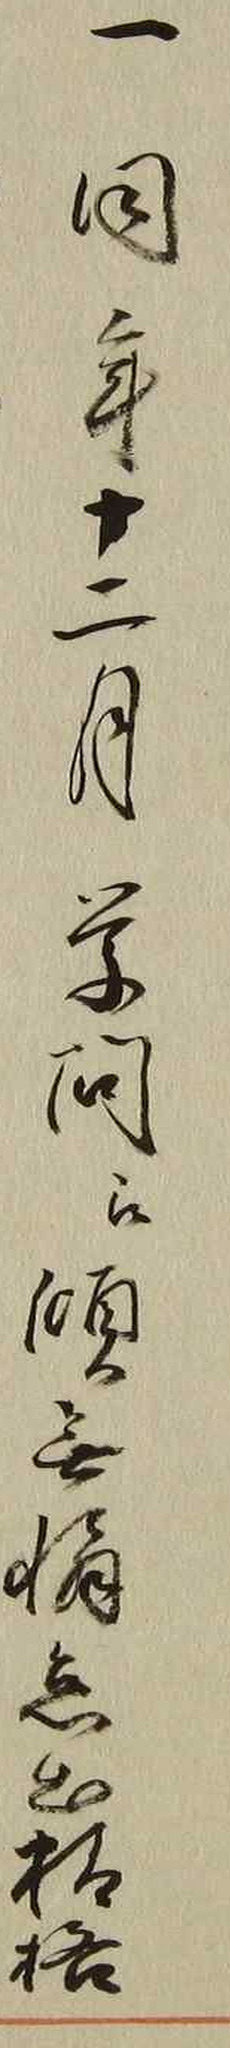一同年十二月学問江傾無懈怠出精格
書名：諸士系譜　巻之68　を之部2
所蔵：会津若松市立会津図書館
